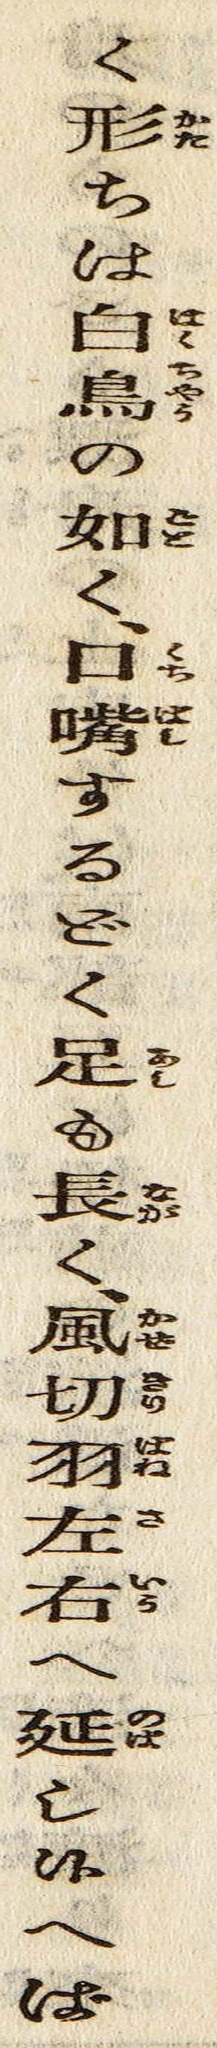く形ちは白鳥の如く、口嘴するどく足も長く、風切羽左右へ延し候へば
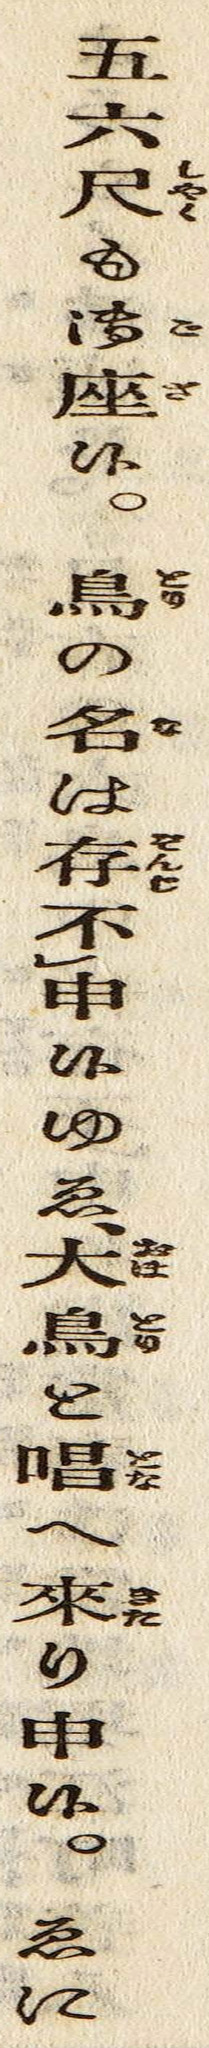五六尺も御座候。鳥の名は存不申候ゆゑ、大鳥と唱へ来り申候。ゑに
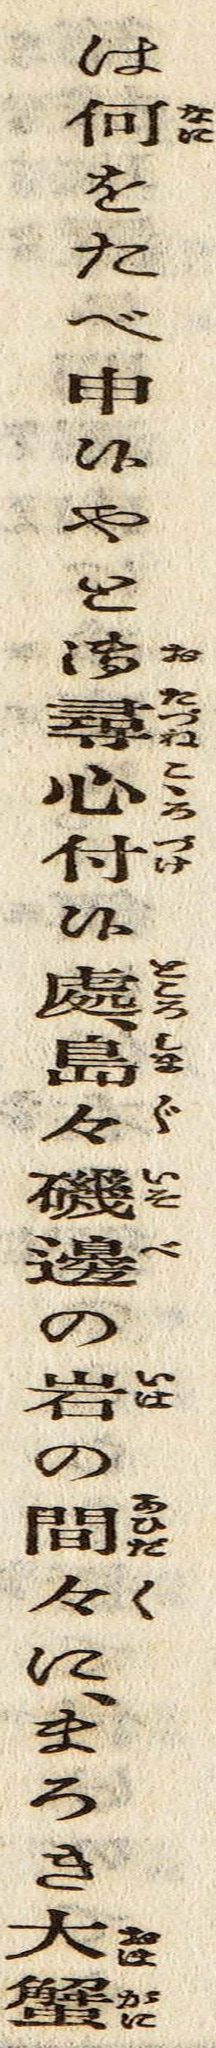は何をたべ申候やと御尋心付候処、島々磯辺の岩の間々に、まろき大蟹
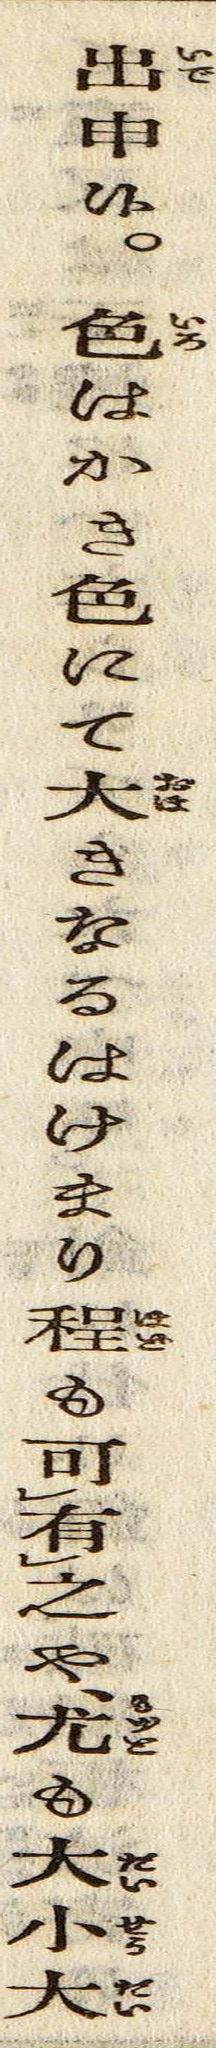出申候。色はかき色にて大きなるはけまり程も可有之や、尤も大小大
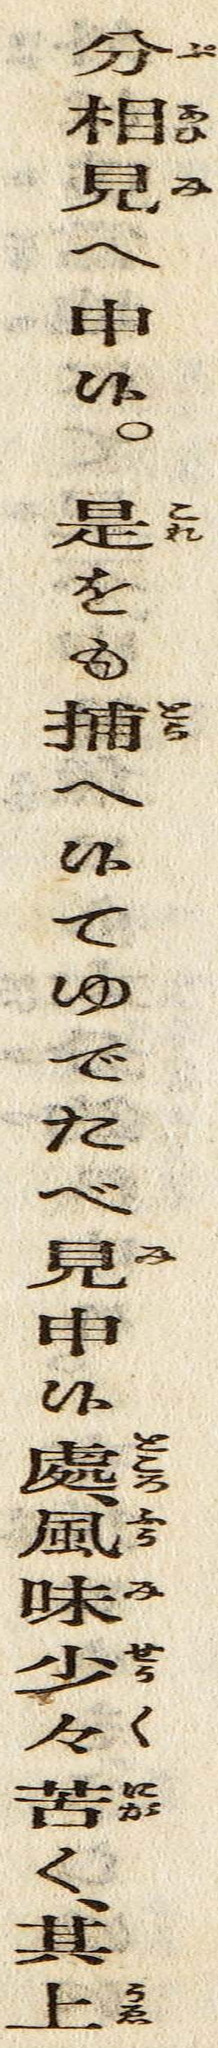分相見へ申候。是をも捕へ候てゆでたべ見申候処、風味少々苦く、其上
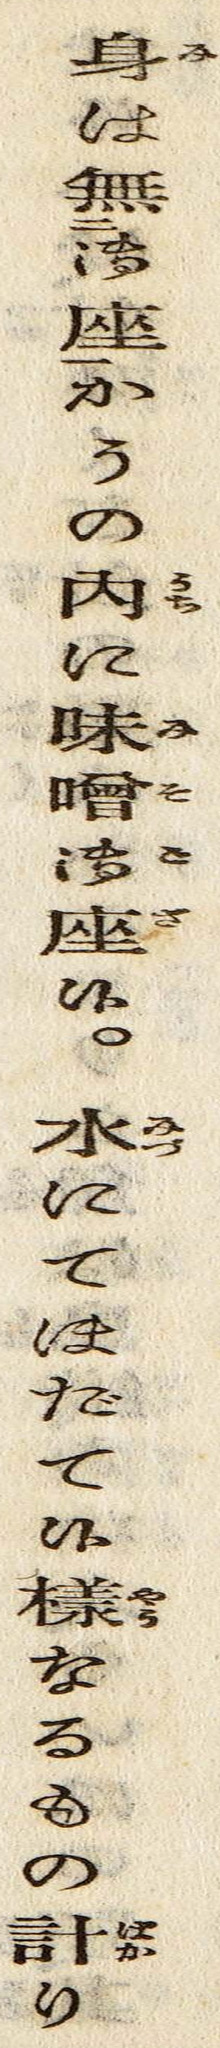身は無御座かうの内に味噌御座候。水にてほだて候様なるもの計り
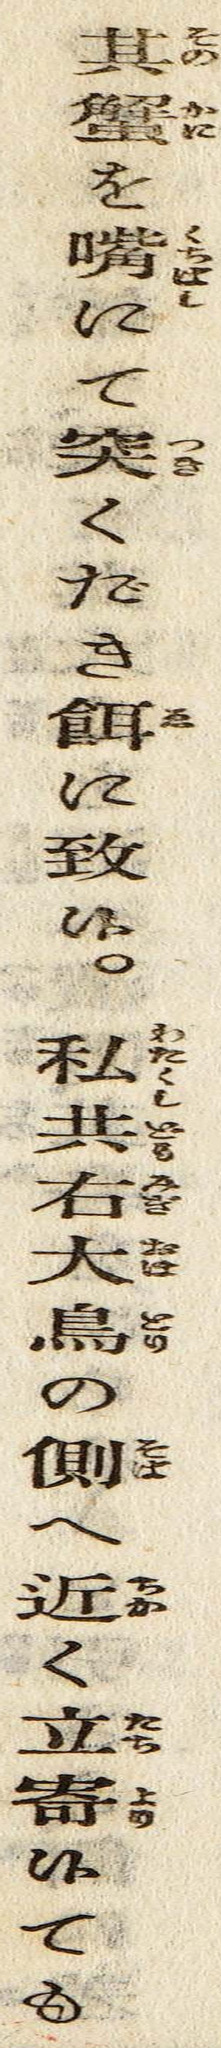其蟹を嘴にて突くだき餌に致候。私共右大鳥の側へ近く立寄候ても
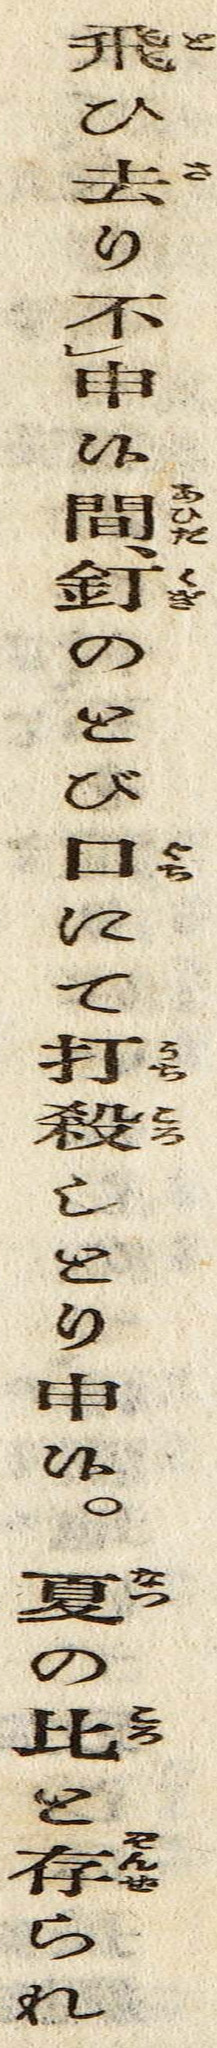飛ひ去り不申候間、釘のとび口にて打殺しとり申候。夏の比と存られ
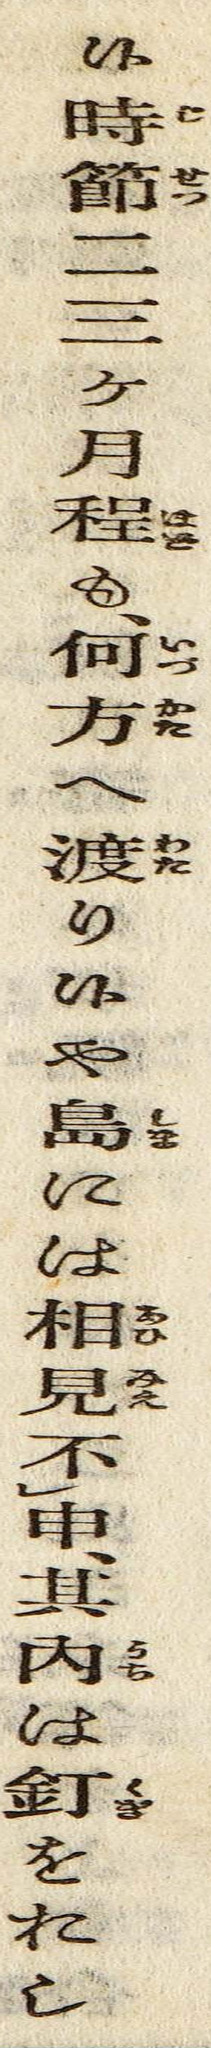候時節二三ケ月程も、何方へ渡り候や島には相見不申、其内は釘をおし

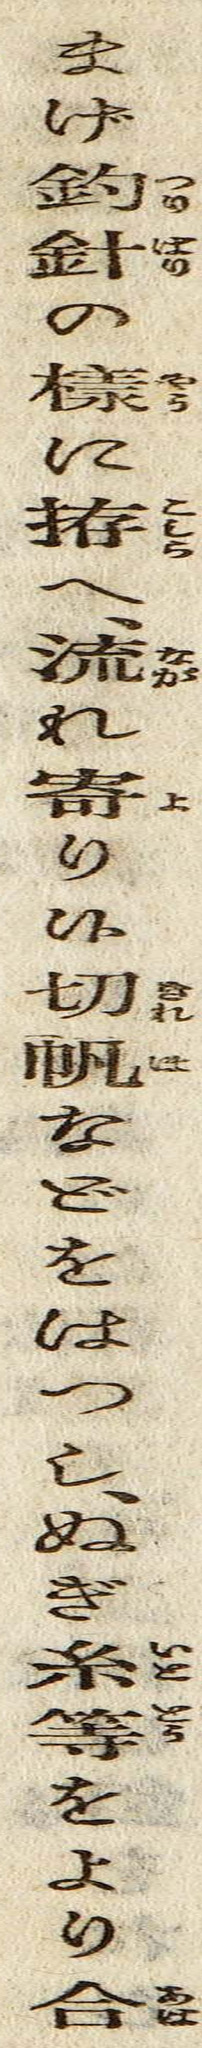まげ釣針の様に拵へ、流れ寄り候切帆などをはつし、ぬぎ糸等をより合
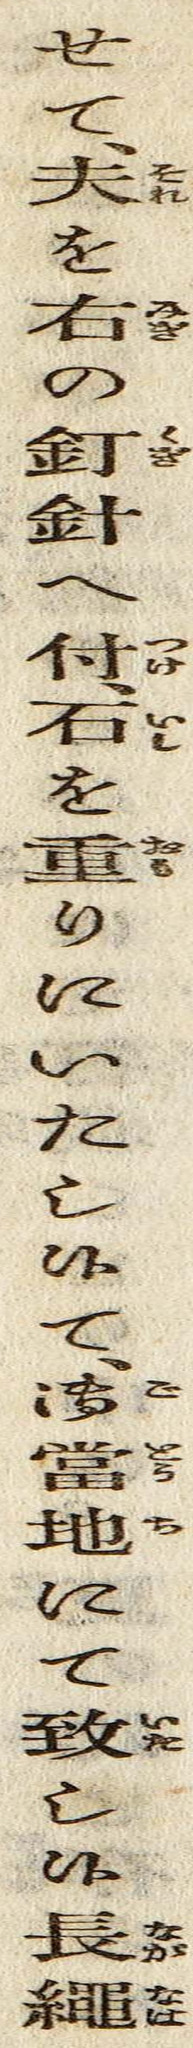せて、夫を右の釘針へ付、石を重りにいたし候て、御当地にて致し候長縄
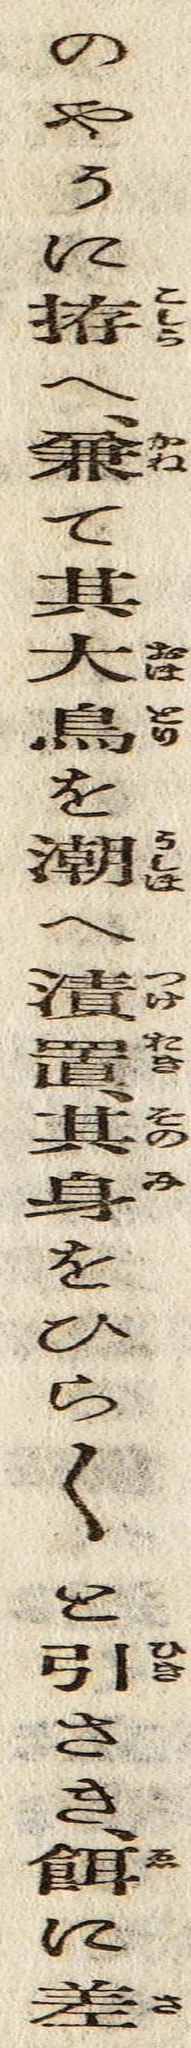のやうに拵へ、兼て其大鳥を潮へ漬置、其身をひら〳〵と引さき、餌に差
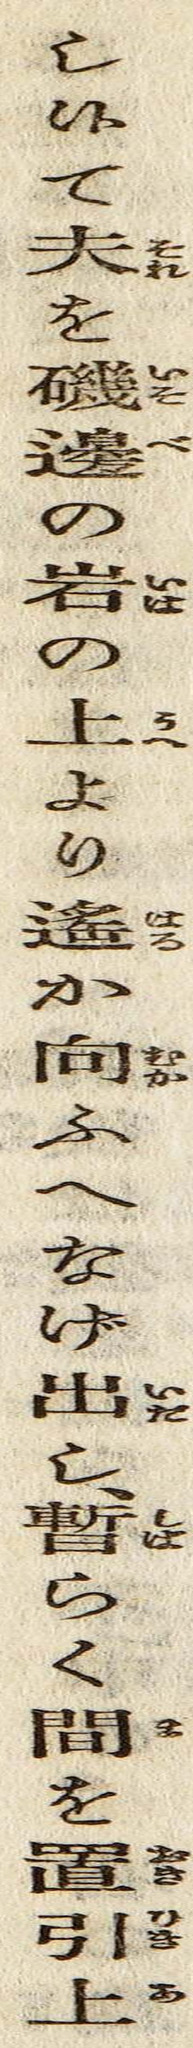し候て夫を磯辺の岩の上より遥か向ふへなげ出し、暫らく間を置引上
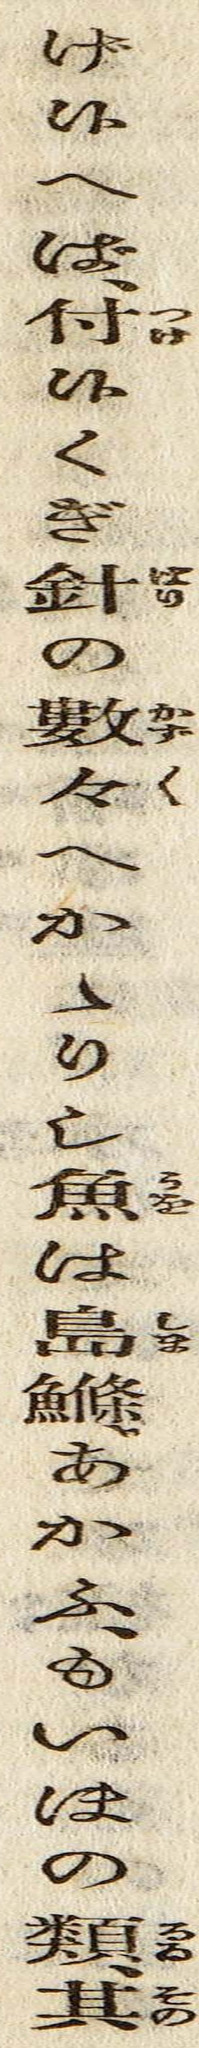げ候へば、付候くぎ針の数々へかゝりし魚は島鰷、あかふ、もいほの類、其
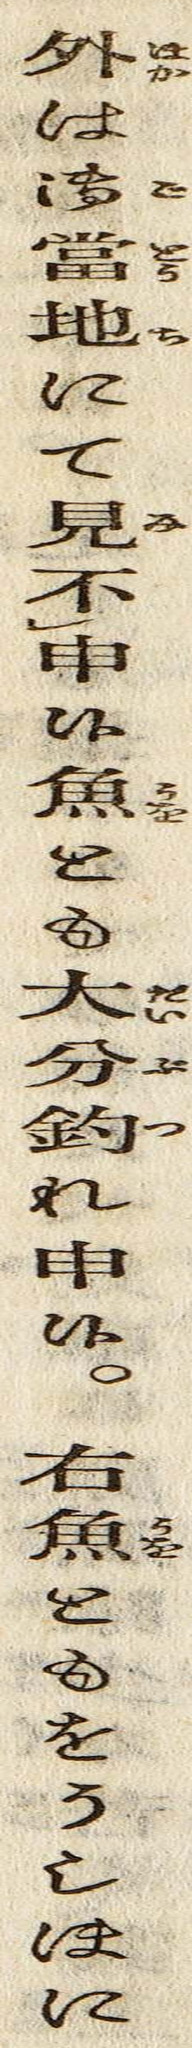外は御当地にて見不申候魚とも大分釣れ申候。右魚ともをうしほに
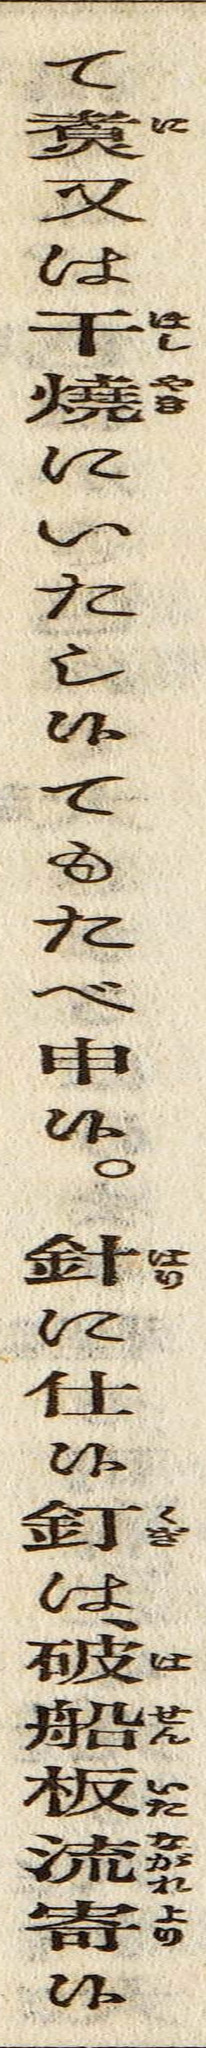て煮又は干焼にいたし候てもたべ申候。針に仕候釘は、破船板流寄候
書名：日本漂流譚
